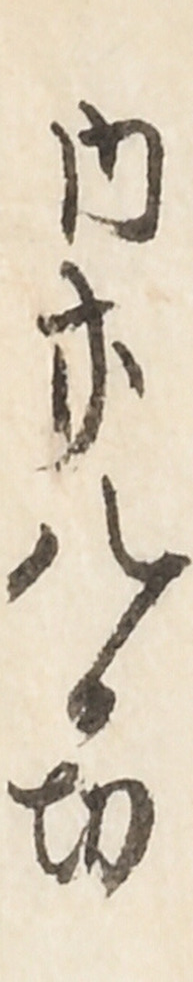内廿八日切
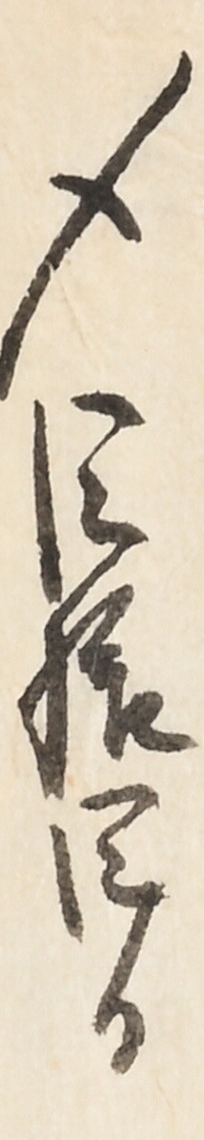〆四拾四日
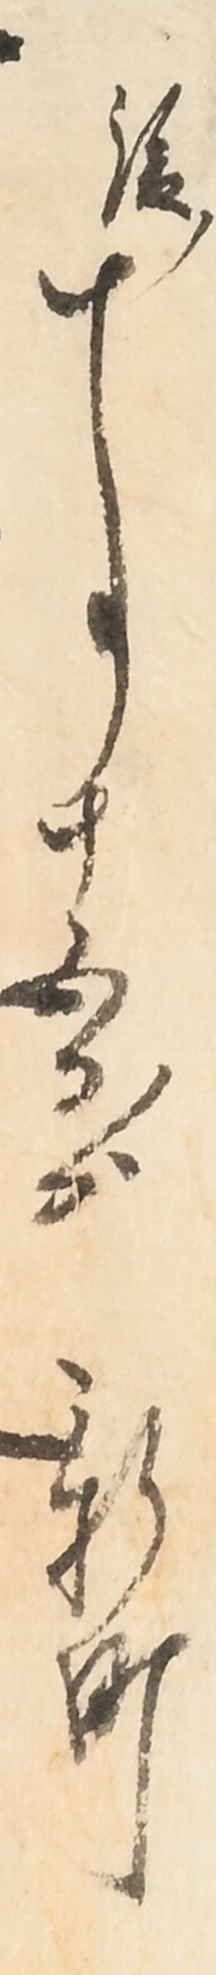十月十二日ゟ新町
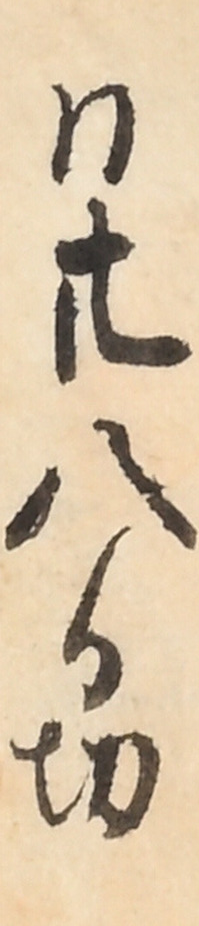同廿八日切

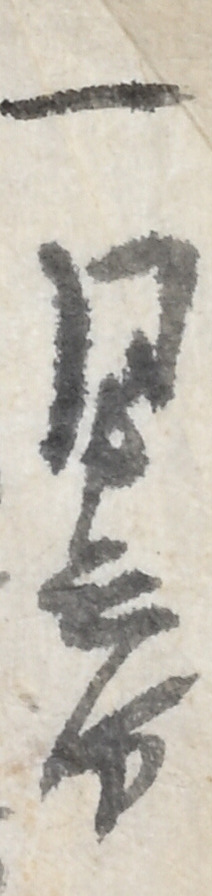一同壱分
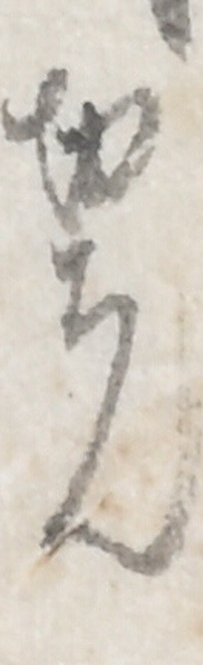切ちん
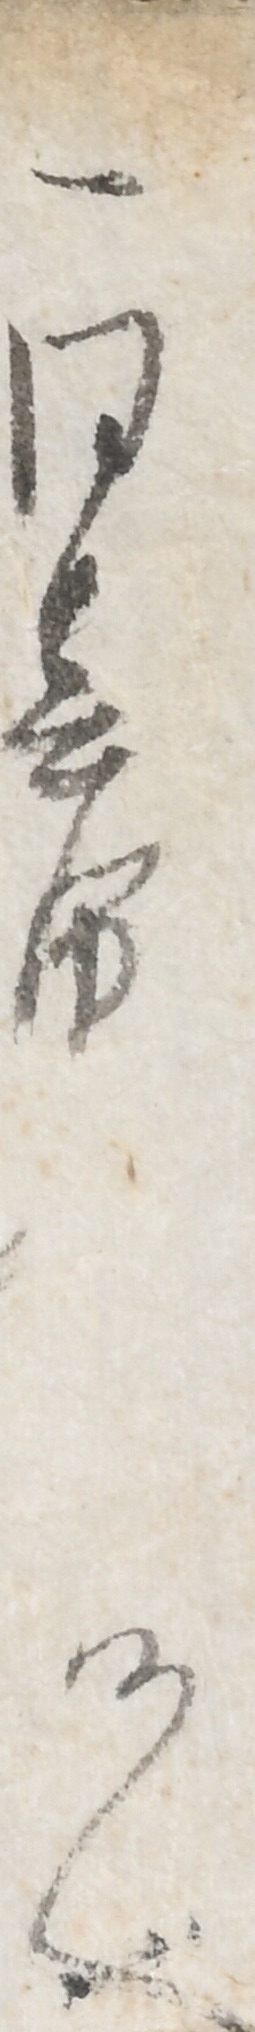一同壱分同人
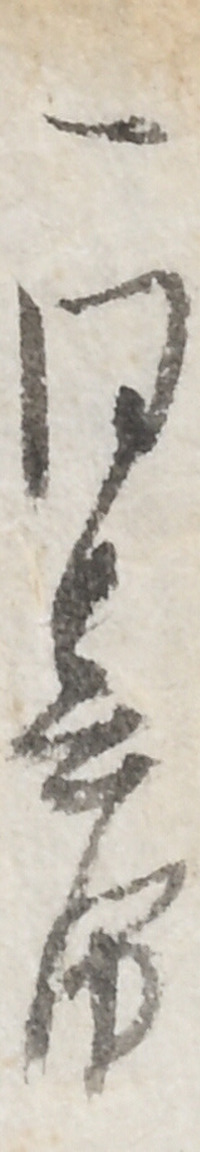一同壱分
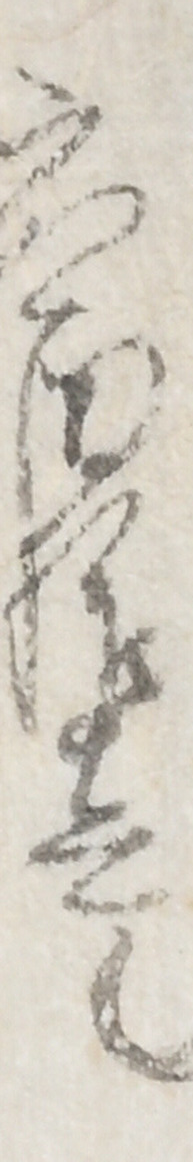六百拾壱文
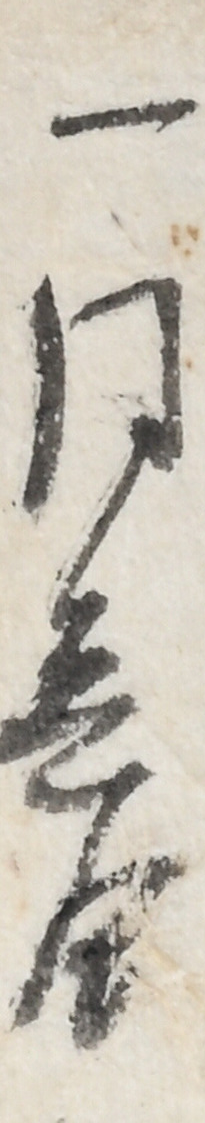一同壱分
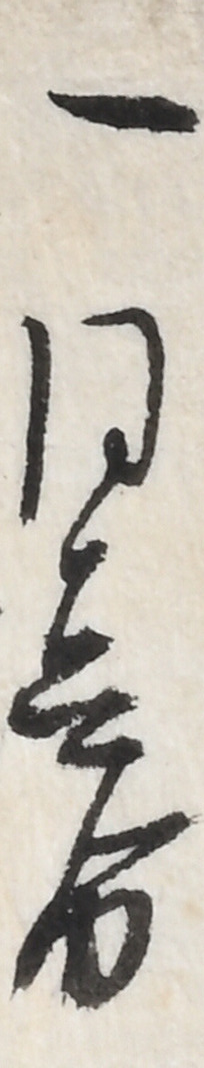一同壱分
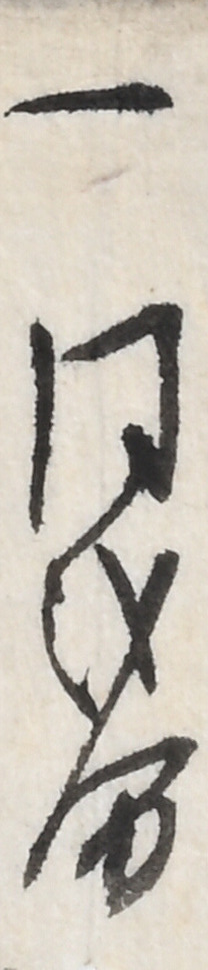一同弐分
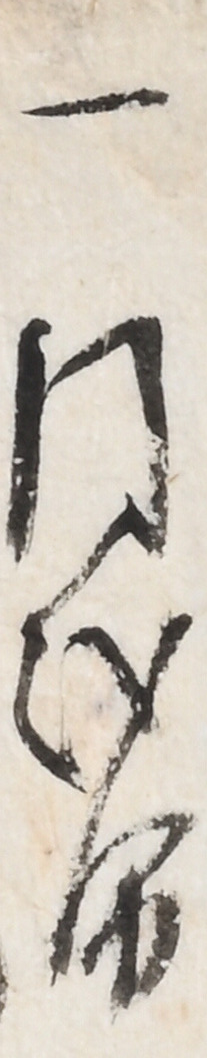一同弐分
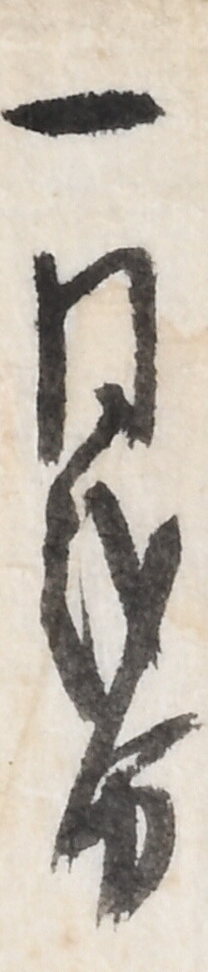一同弐分
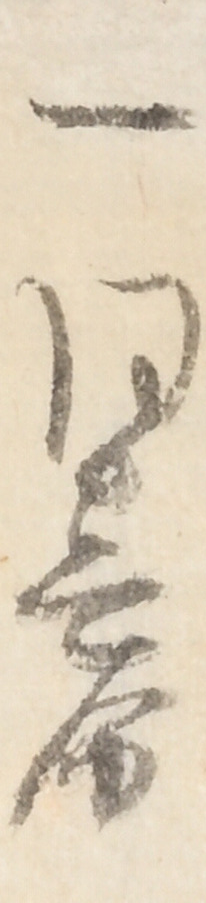一同壱分

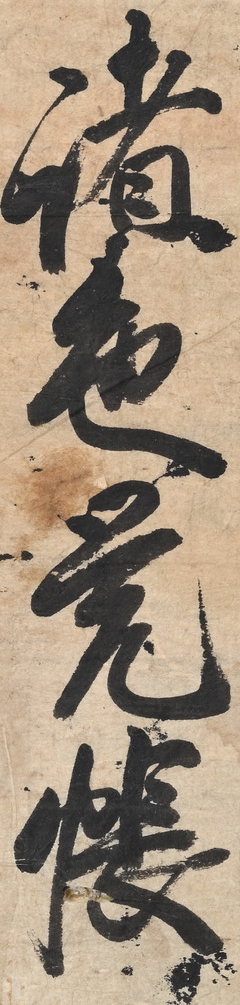諸色覚帳
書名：合力覚帳
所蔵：伊那市立高遠町図書館・合同会社AMANE
